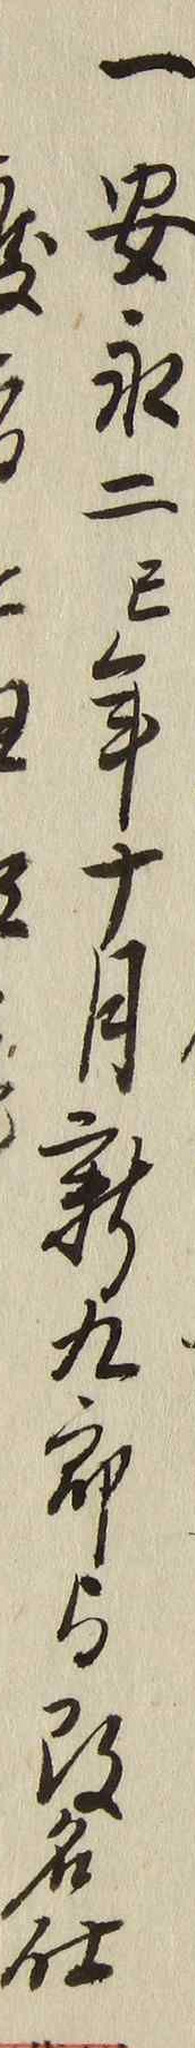一安永二巳年十月新九郎与改名仕
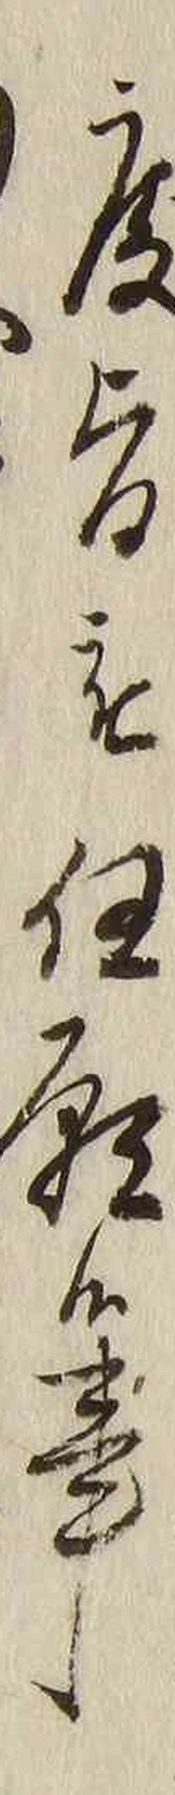度旨被任願候事
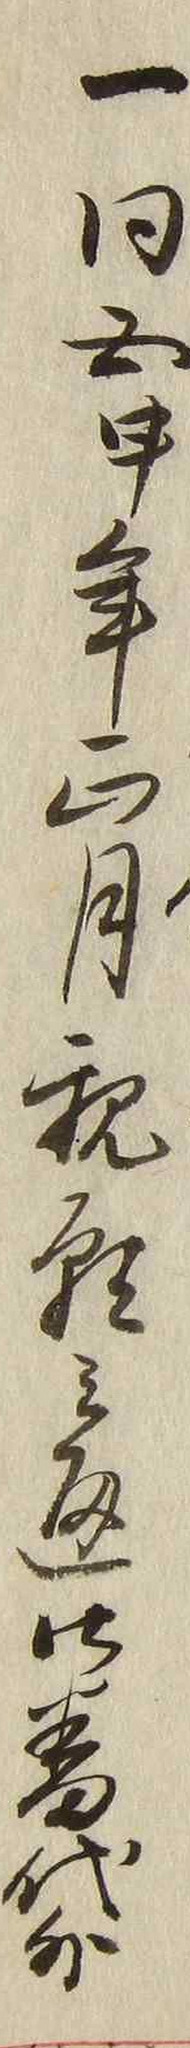一同五申年正月親願之通御番代外

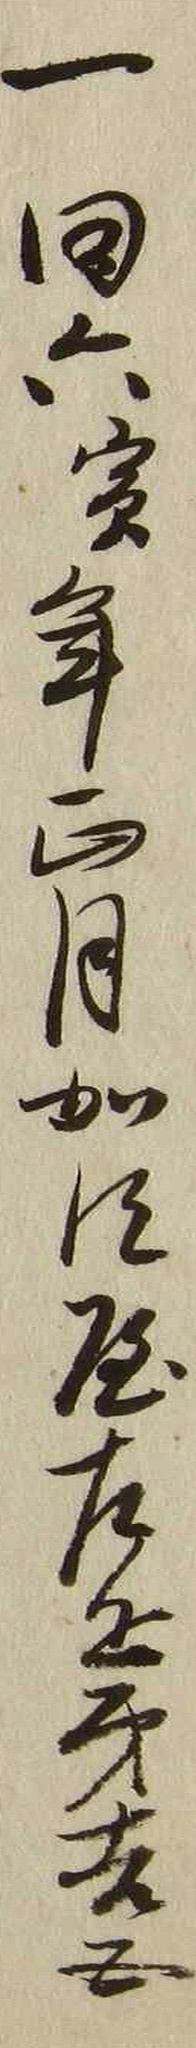一同六寅年正月加須屋左近弟吉五
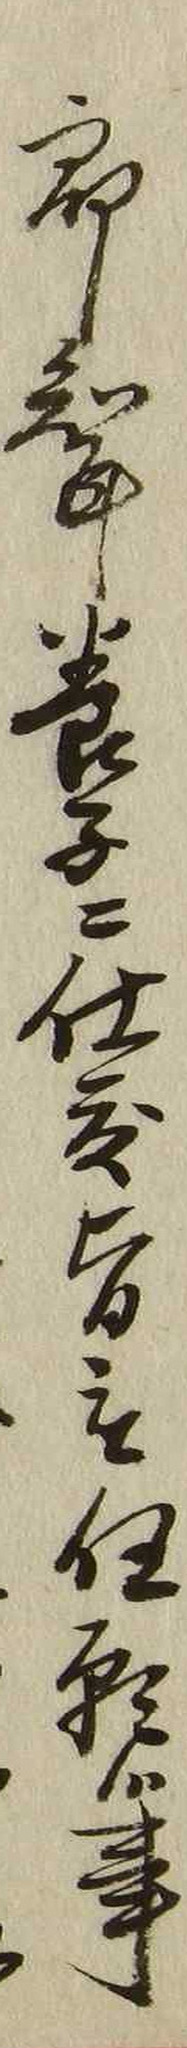郎婿養子ニ仕度旨被任願候事
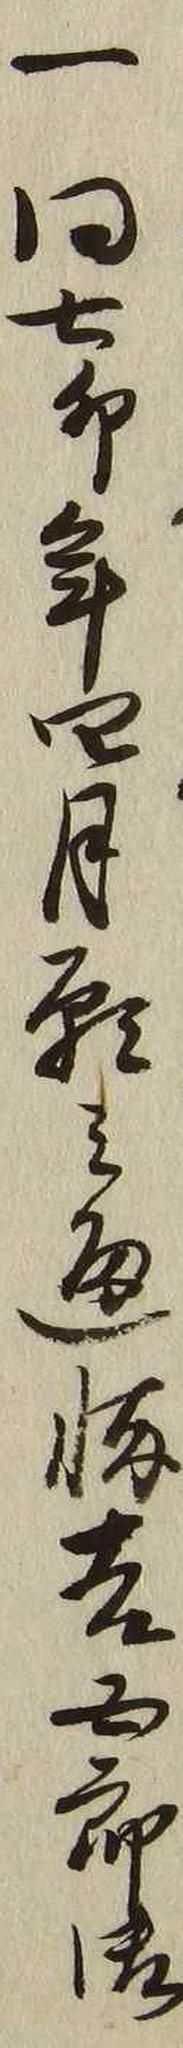一同七卯年四月願之通忰吉五郎御
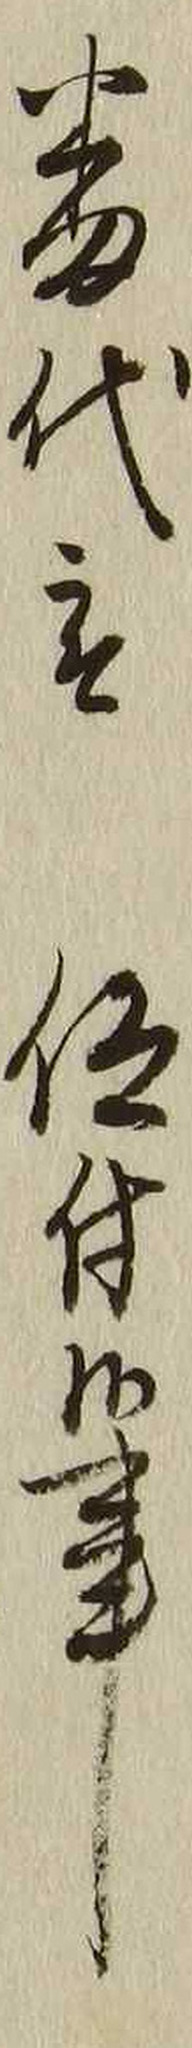番代被仰付候事
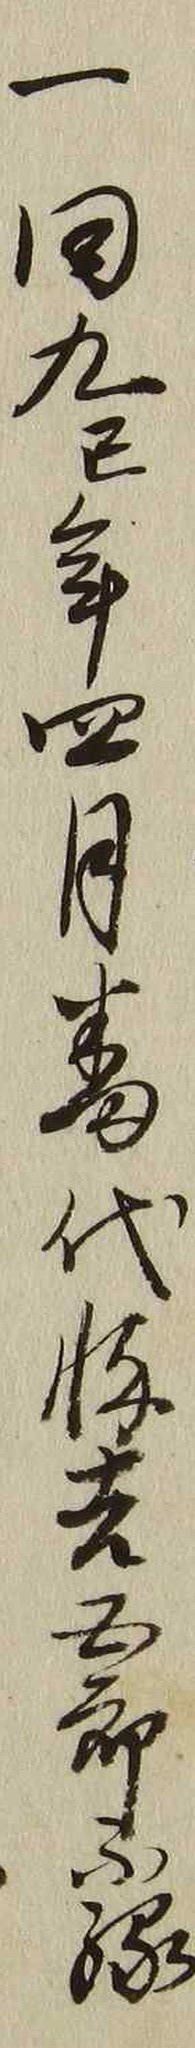一同九巳年四月番代忰吉五郎不縁
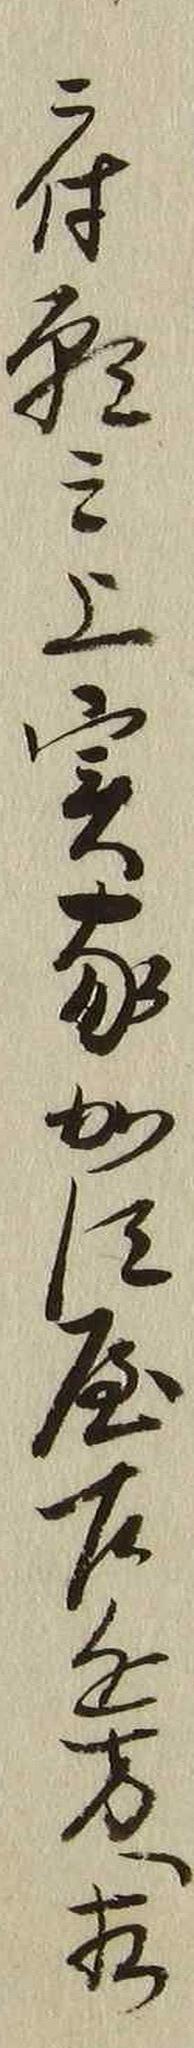ニ付願之上実家加須屋左近方へ相
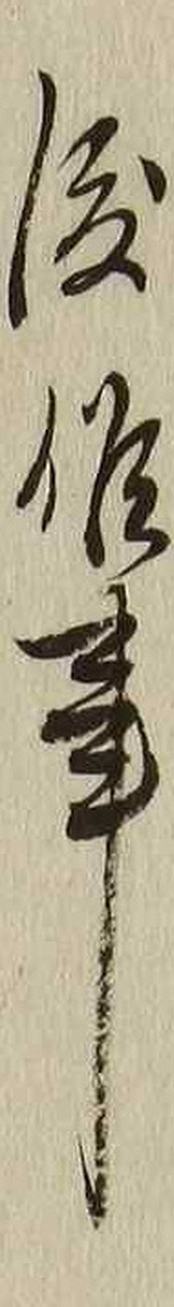渡候事
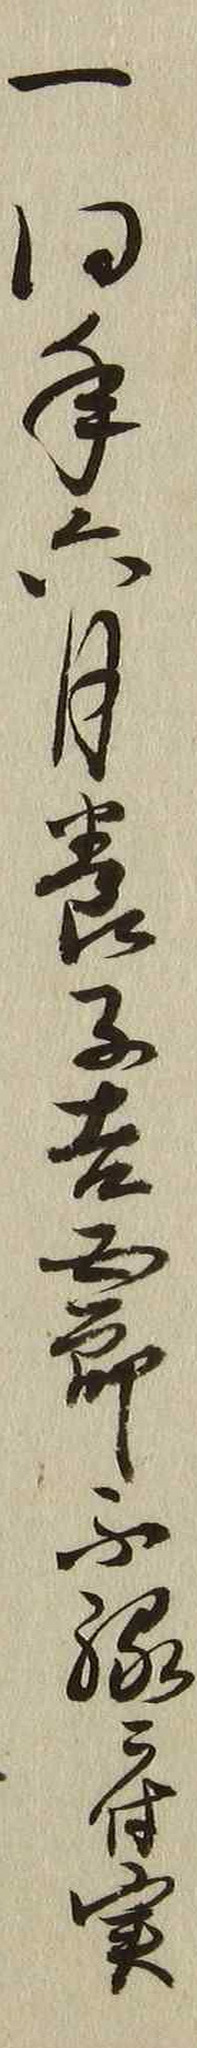一同年六月養子吉五郎不縁ニ付実
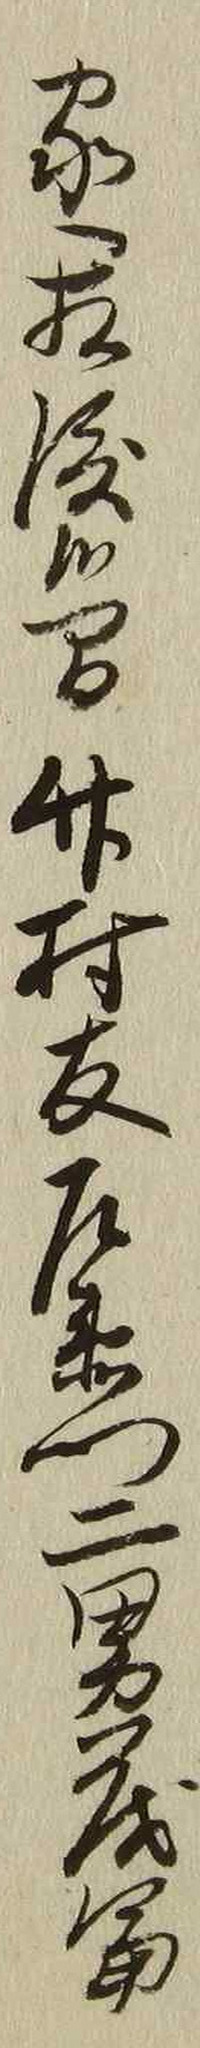家へ相渡候間竹村友左衛門二男茂富
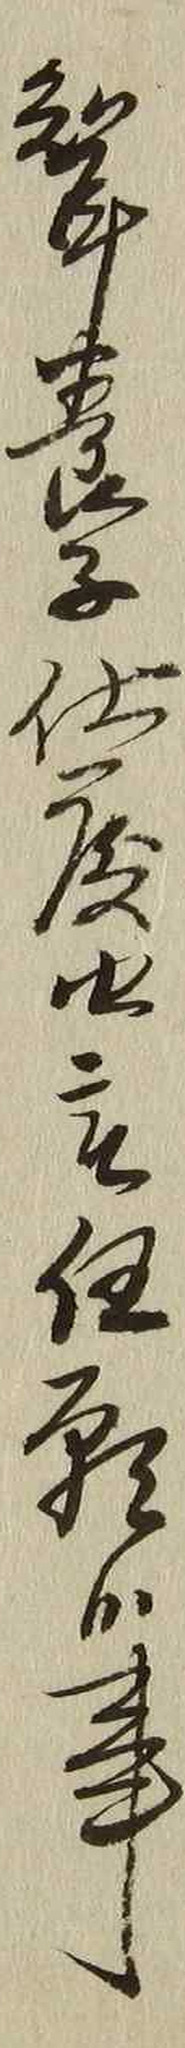婿養子仕度由被任願候事
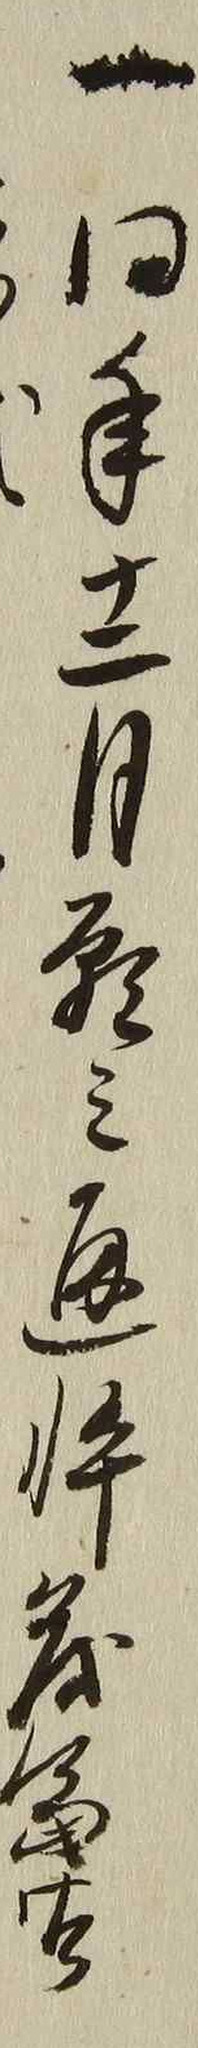一同年十二月願之通忰茂富御
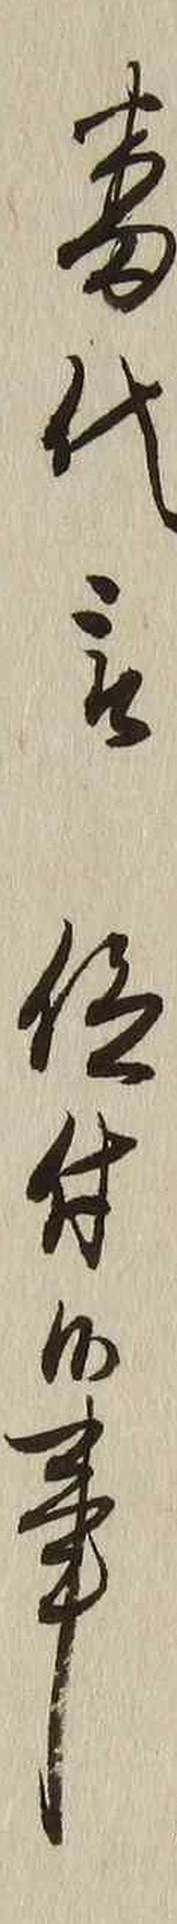番代被仰付候事
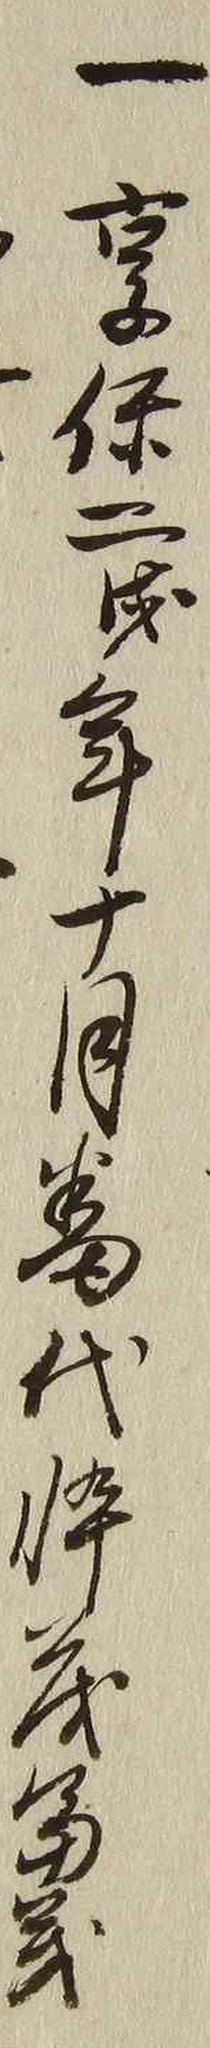一享保二戌年十月番代忰茂富義
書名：諸士系譜　巻之348　も之部4
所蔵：会津若松市立会津図書館
